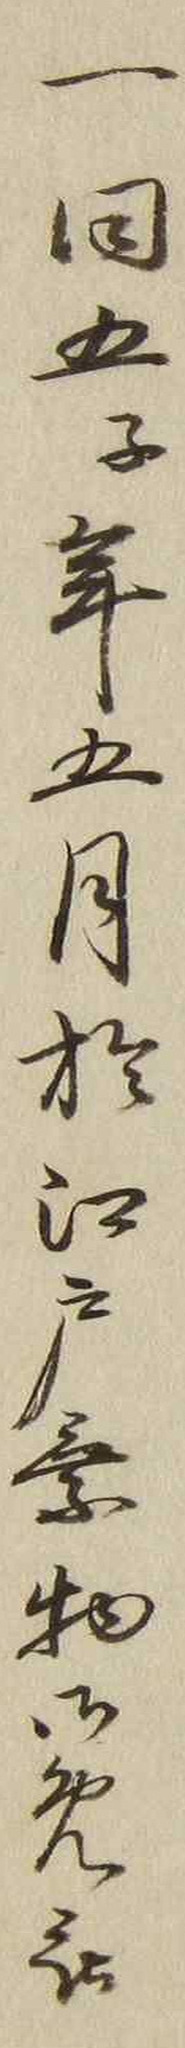一同五子年五月於江戸乗物御免被

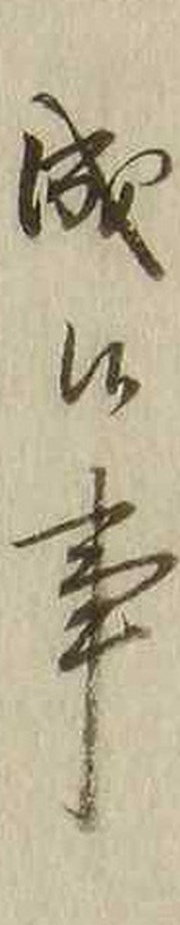成候事
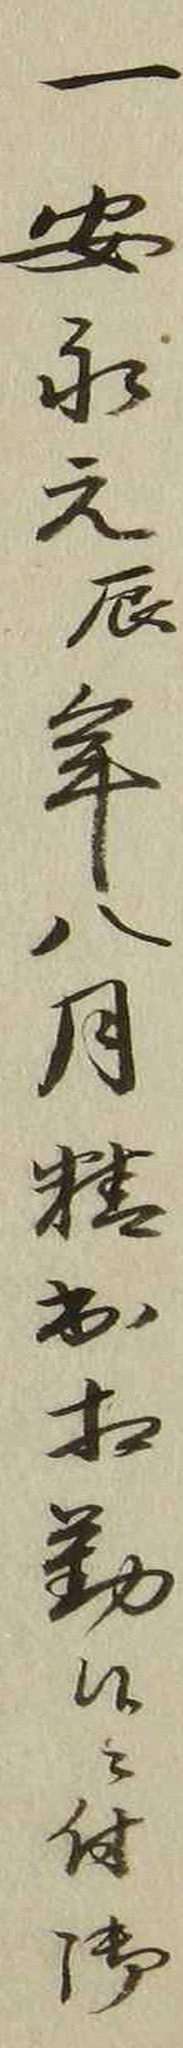一安永元辰年八月精出相勤候に付御
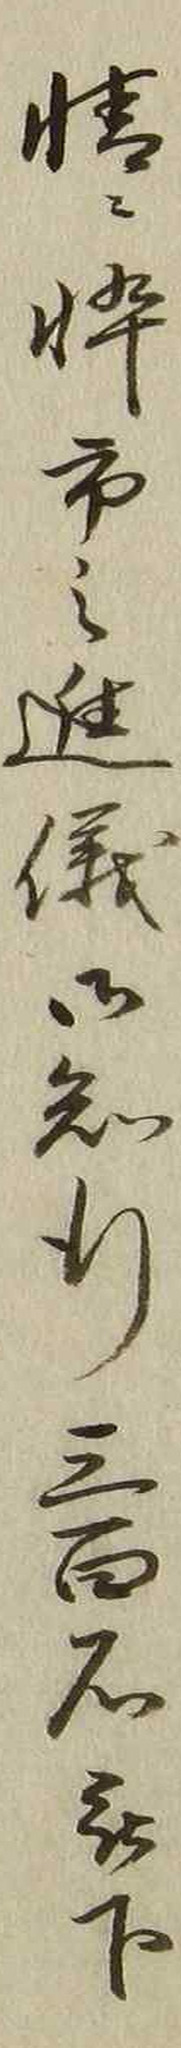情に忰市之進儀御知行三百石被下
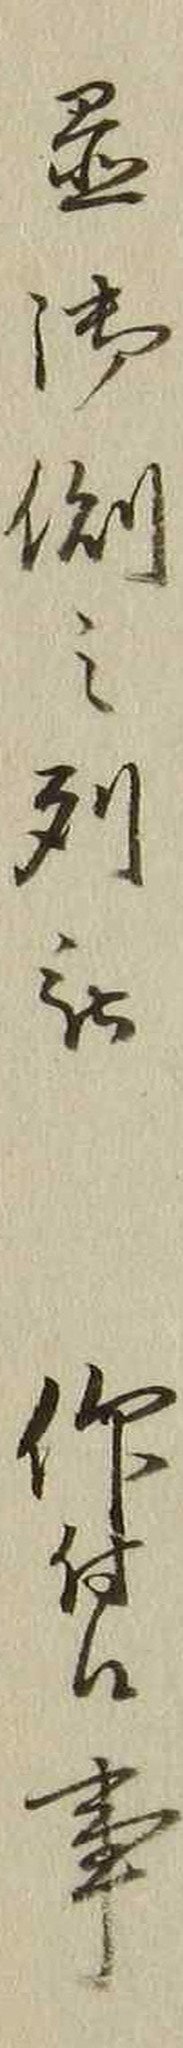置御側之列被仰付候事
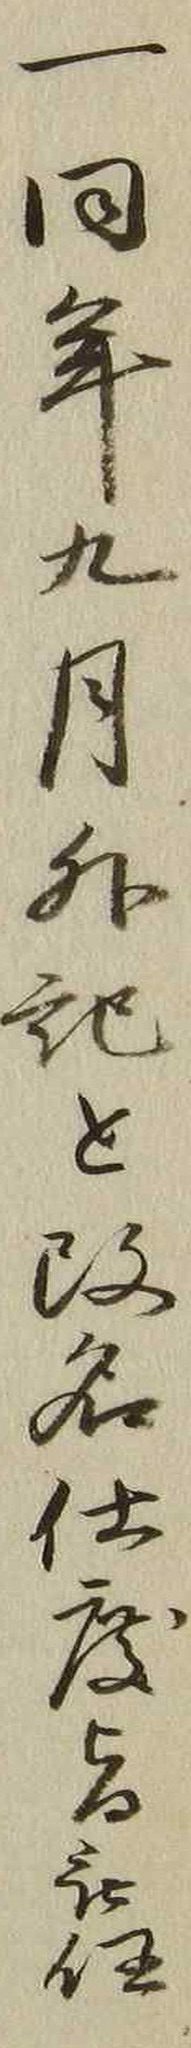一同年九月外記と改名仕度旨被任
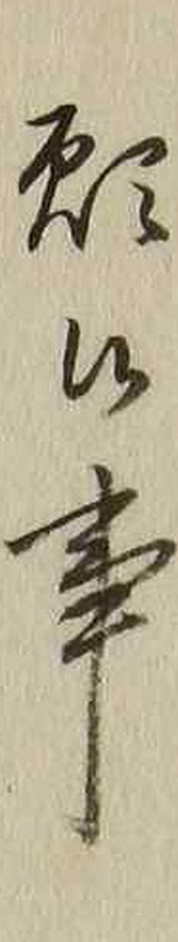願候事
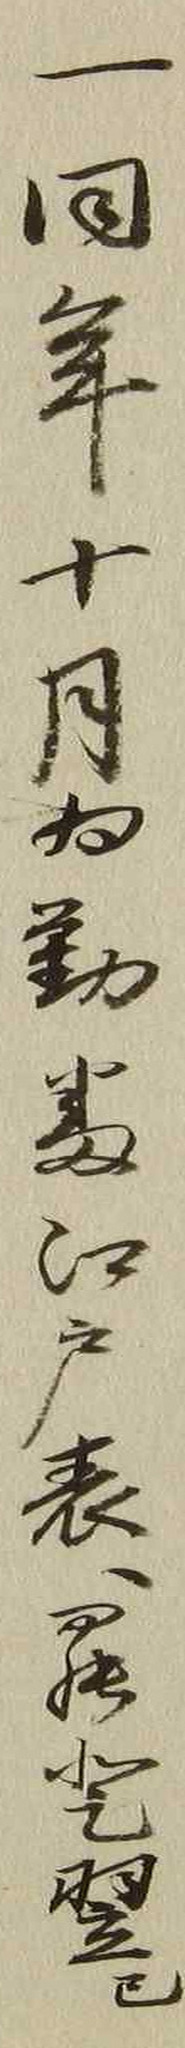一同年十月為勤番江戸表へ罷登翌巳
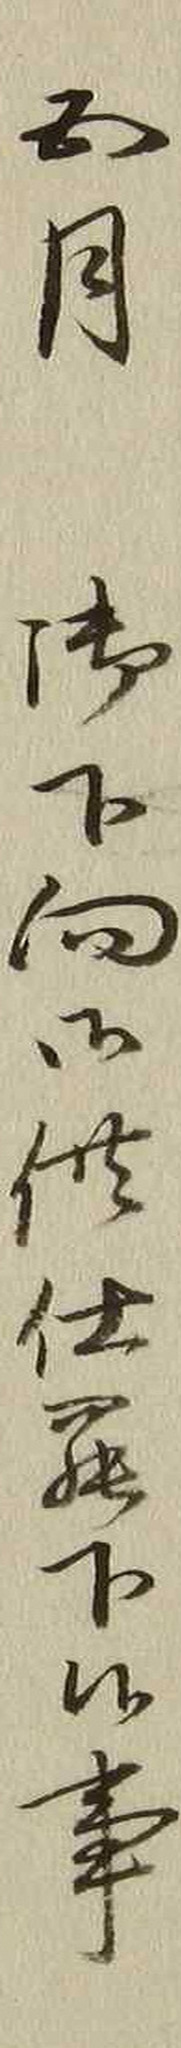五月御下向御供仕罷下候事
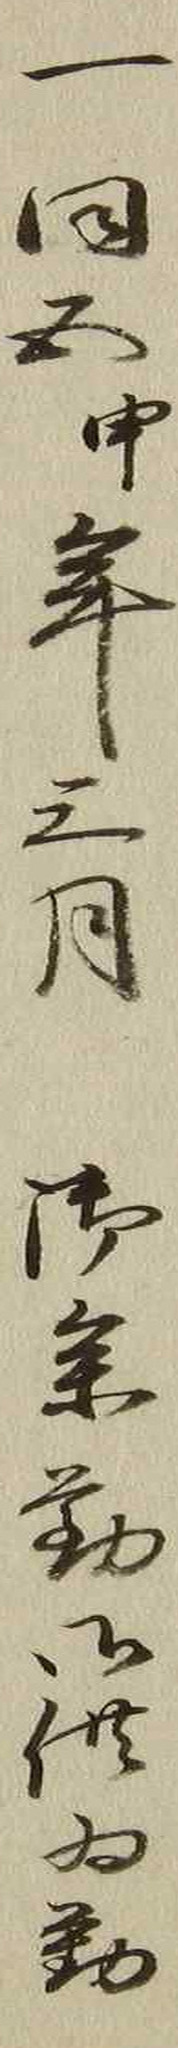一同五申年三月御参勤御供為勤
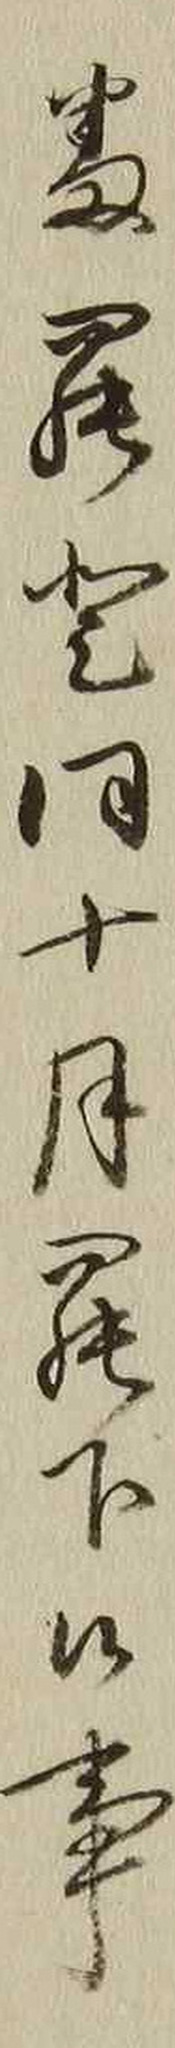番罷登同十月罷下候事
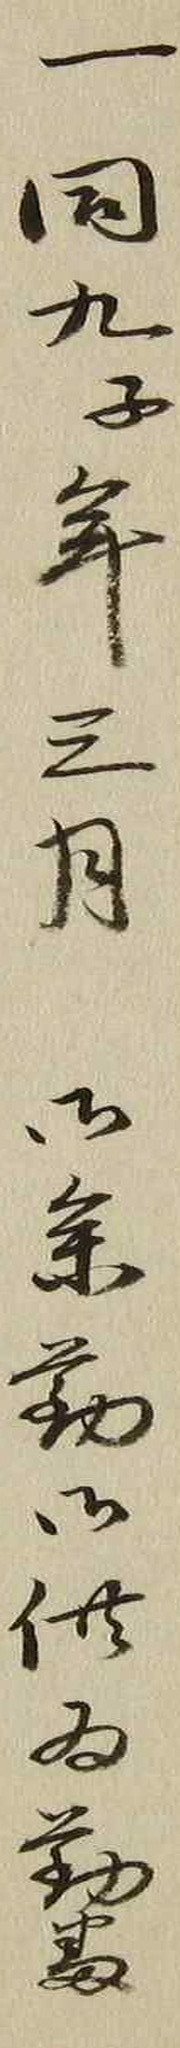一同九子年三月御参勤御供為勤番
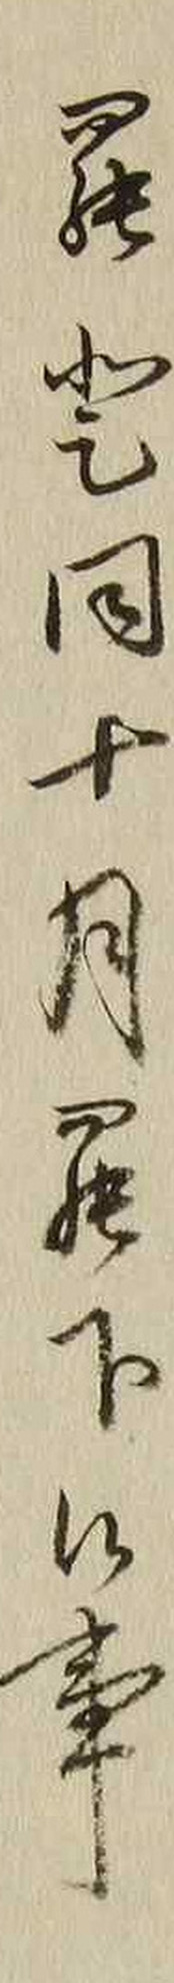罷登同十月罷下候事
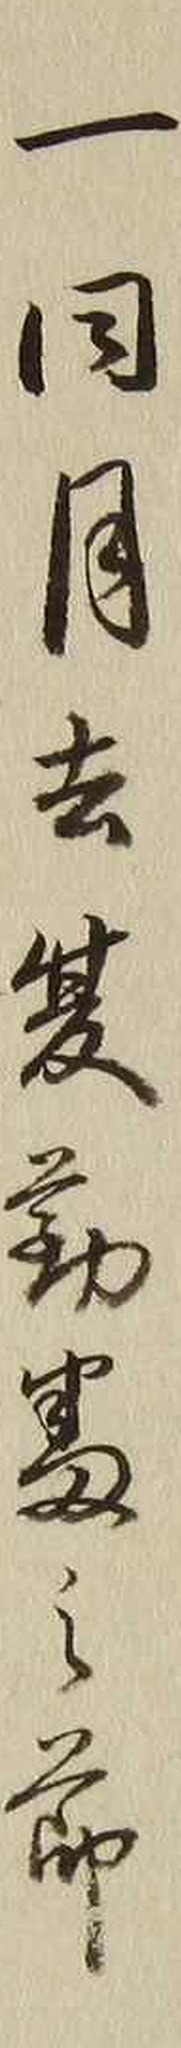一同月去夏勤番之節
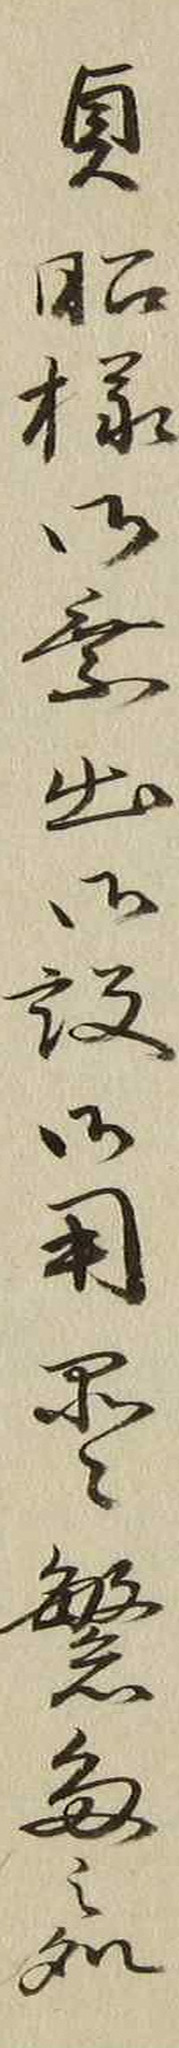貞昭様御乗出御設御用品々繁多之処
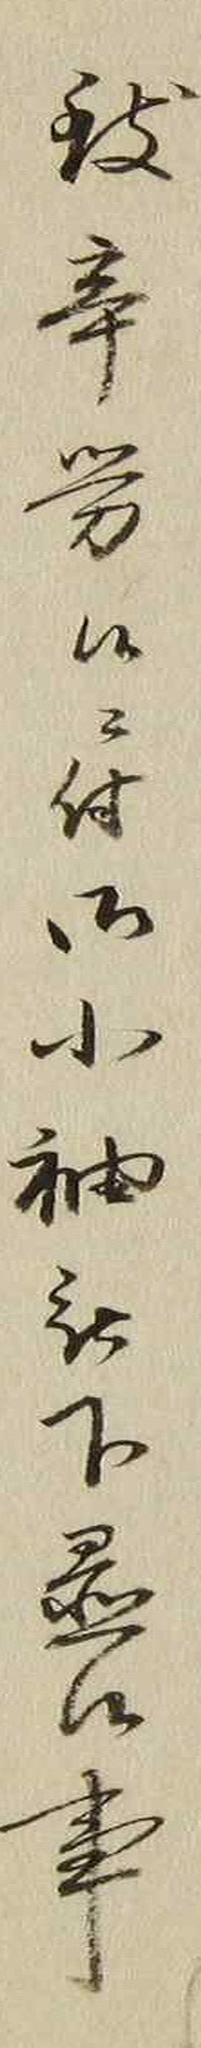致辛労候に付御小袖被下置候事
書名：諸士系譜　巻之133　た之部9
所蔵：会津若松市立会津図書館
